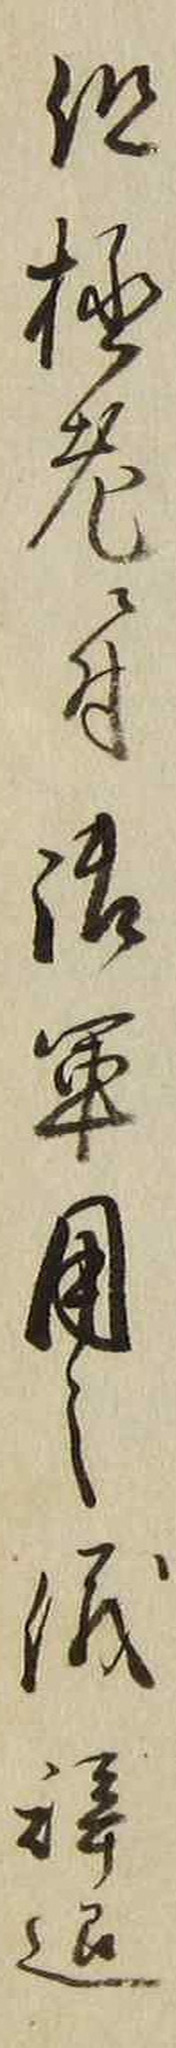但極老ニ付御軍用之儀辞退

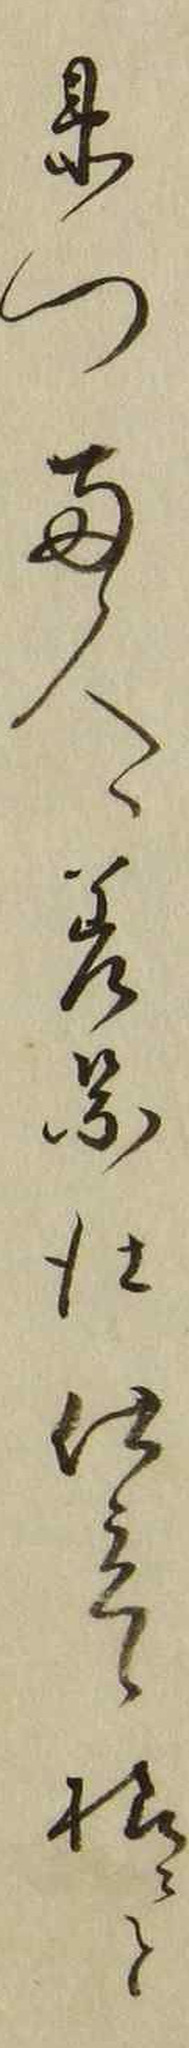衛門両人へ差図仕仕立候様ニと
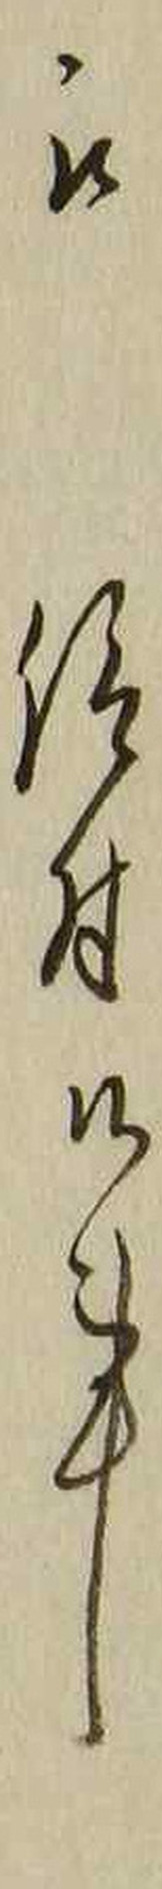被仰付候事
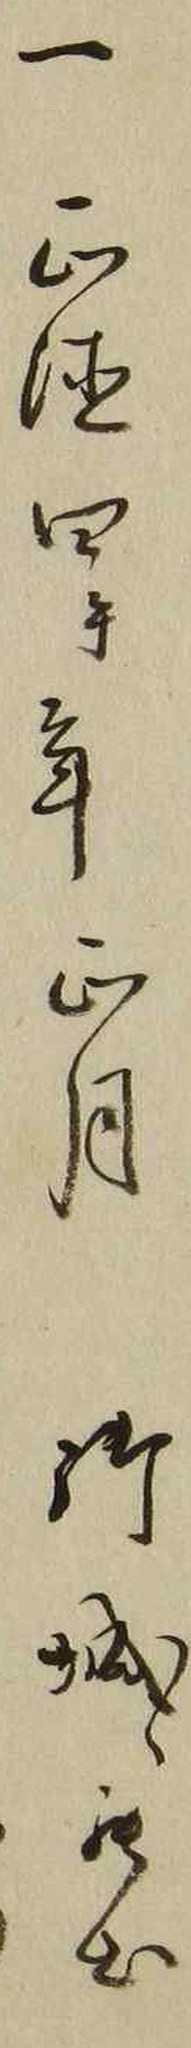一正徳四午年正月御城へ罷出
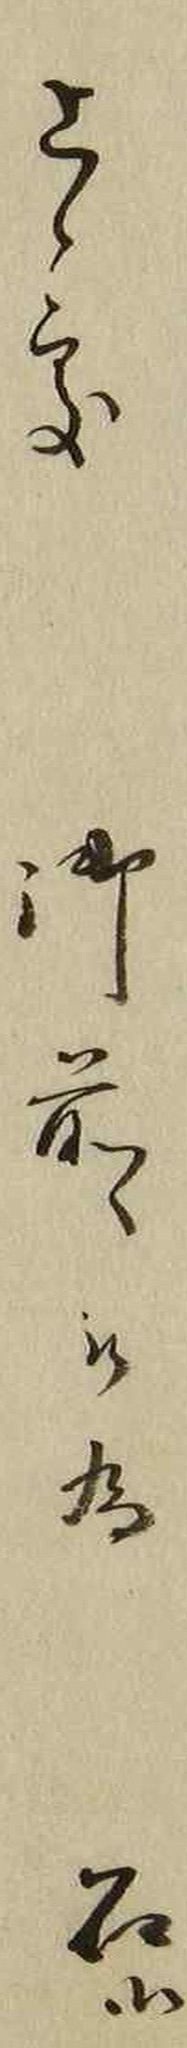上候処御前へ被為召御
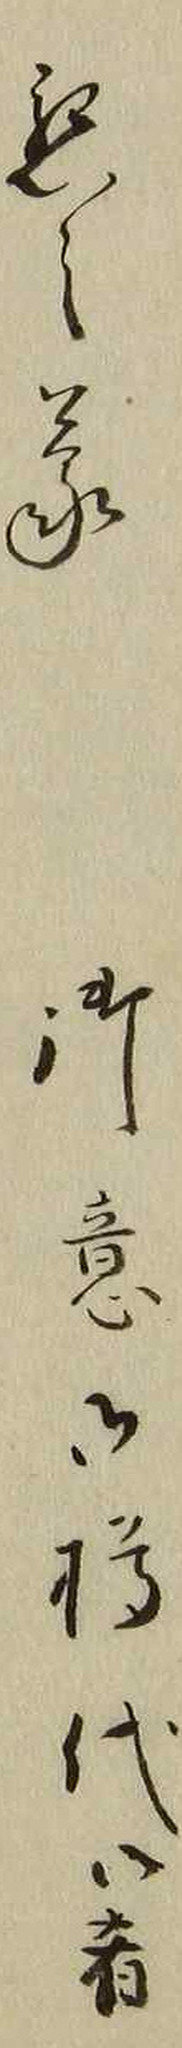懇之蒙御意御樽代御肴
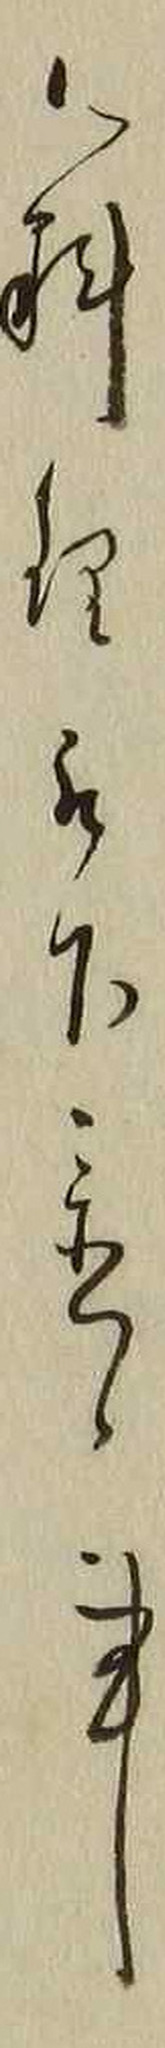御料理被下置候事
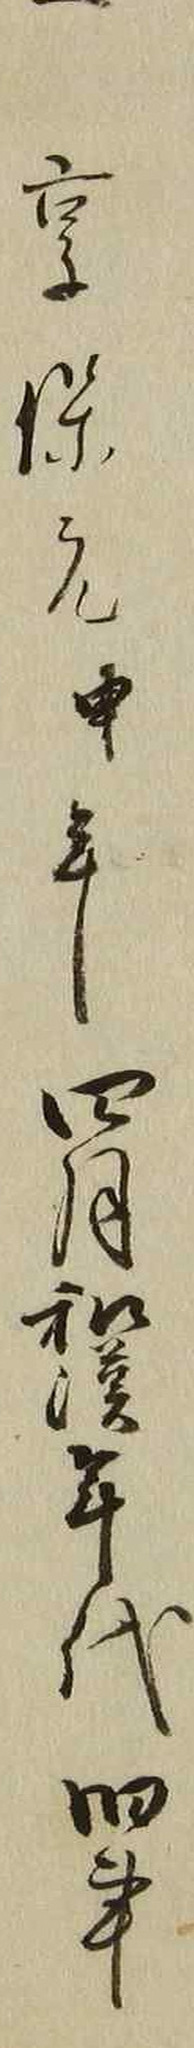一享保元申年四月和漢年代旧事
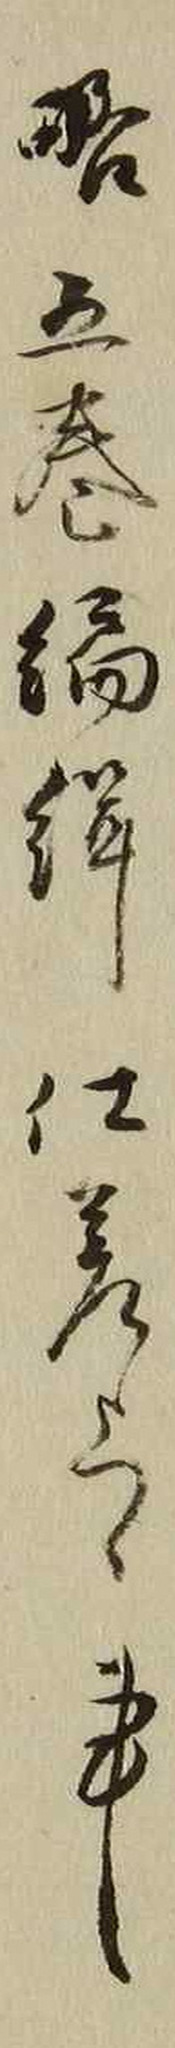略五巻編輯し差上候事
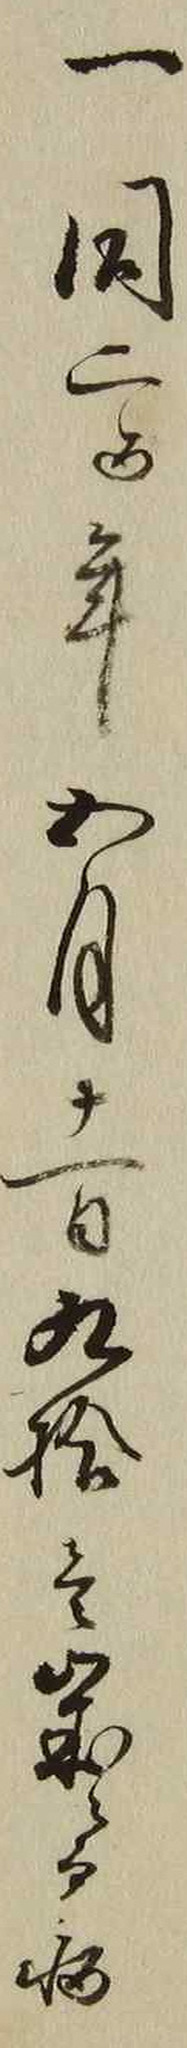一同二酉年五月十一日九拾壱歳ニ而病
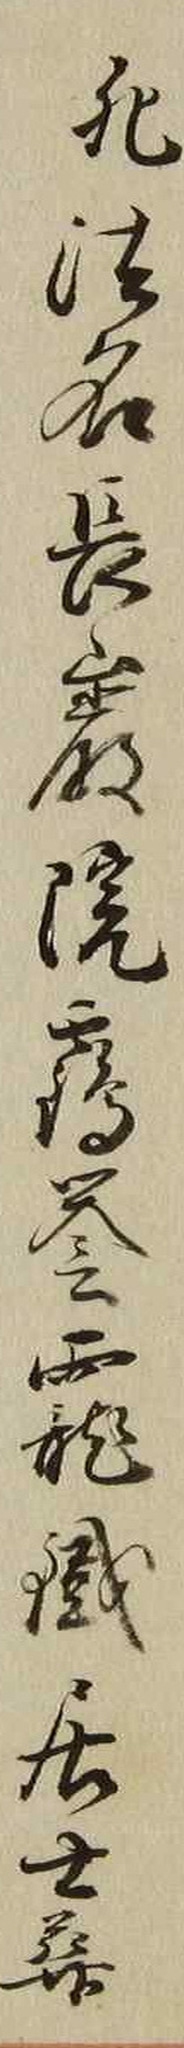死法名長巌院鶴誉靇鉄居士葬
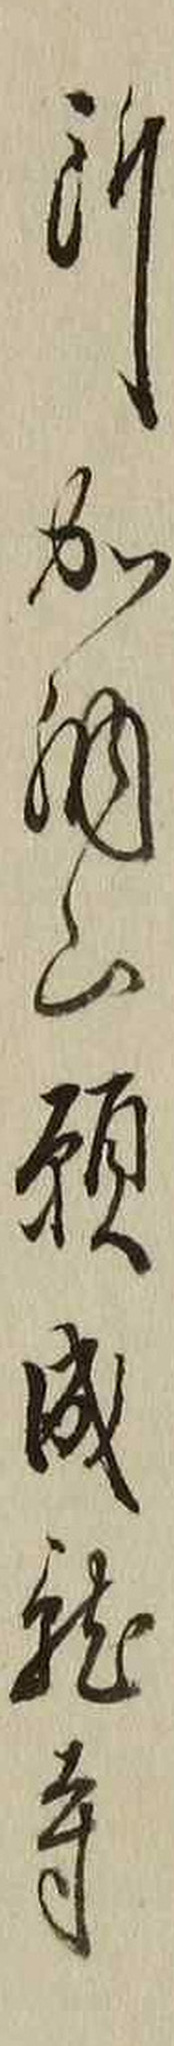所加納山願成龍寺
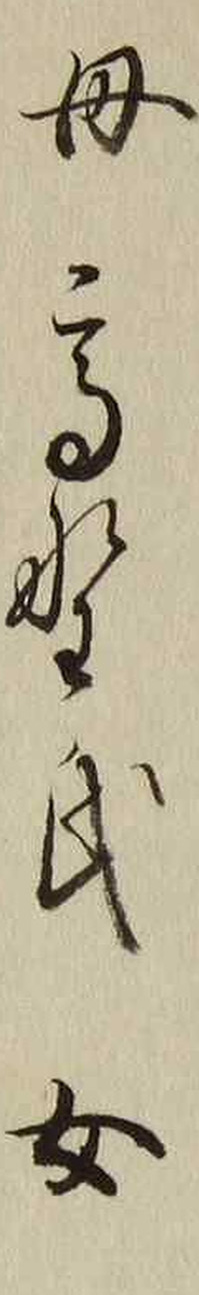母高野氏女
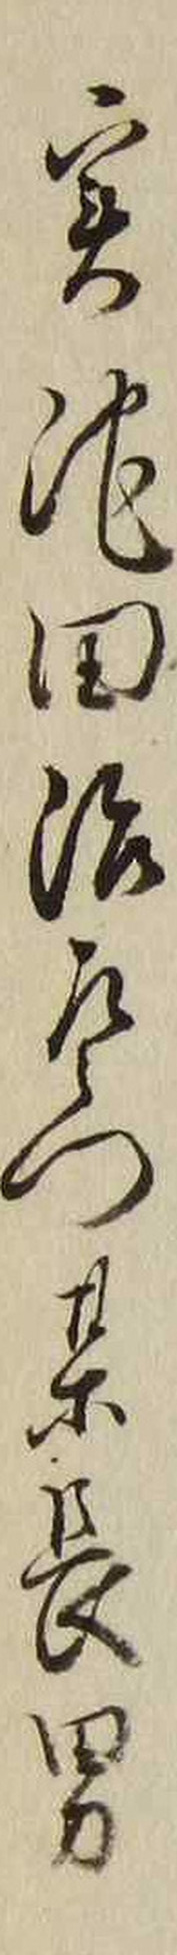実池田治左衛門某長男

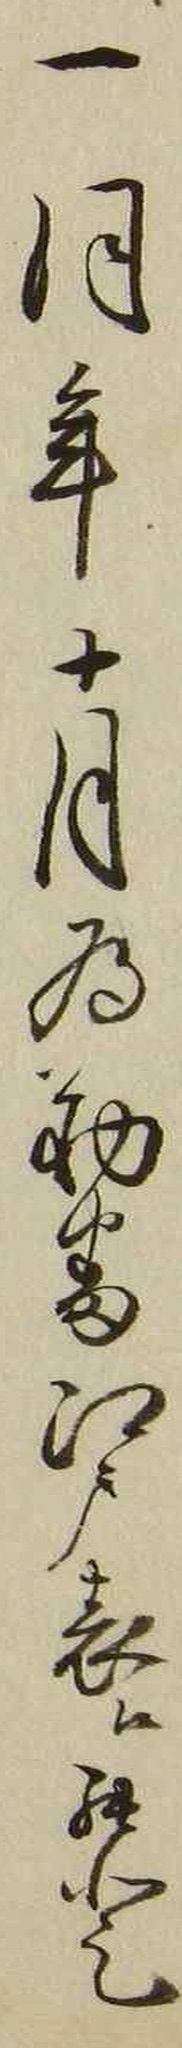一同年十月為勤番江戸表江罷登
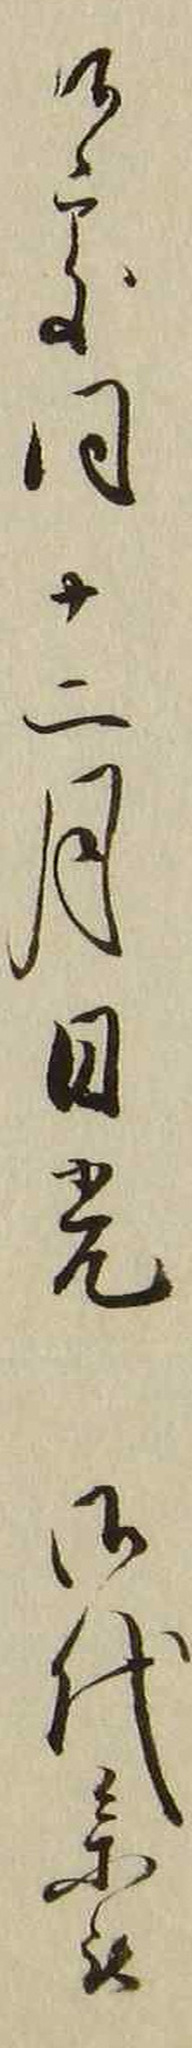候処同十二月日光御代参被
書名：諸士系譜　巻之1　い之部1
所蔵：会津若松市立会津図書館
